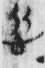忻
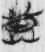莫
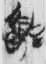囂
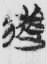遠
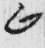㠯
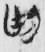○（廷）
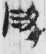阩
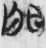門
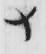又（有）
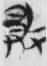敗
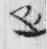疋
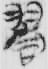○（旌）
